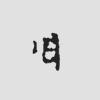門
